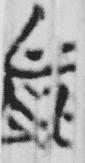能
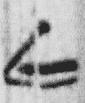㠯（以）
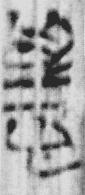○（偽）
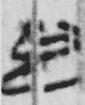也
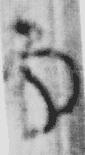可
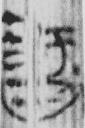智（知）
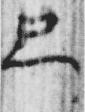也
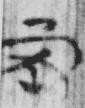不
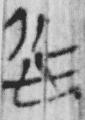○（過）
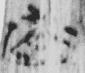直（十）
